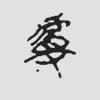虘B
